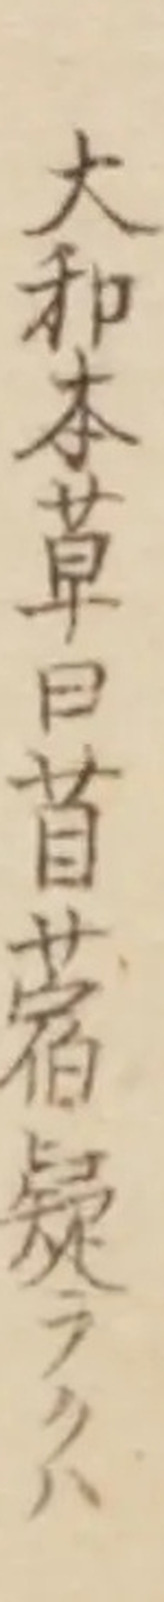大和本草曰苜蓿草疑ラクハ
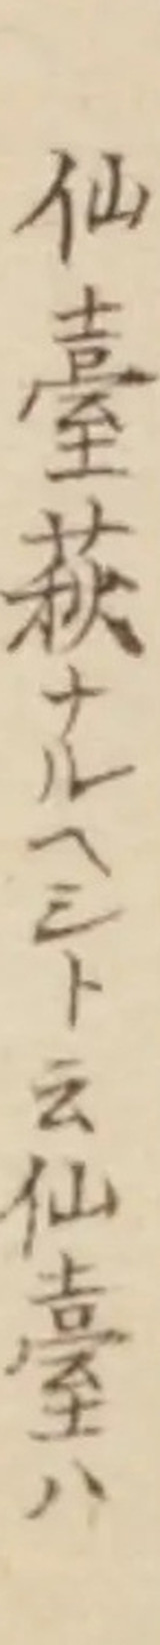仙臺萩ナルヘシト云仙臺ハ
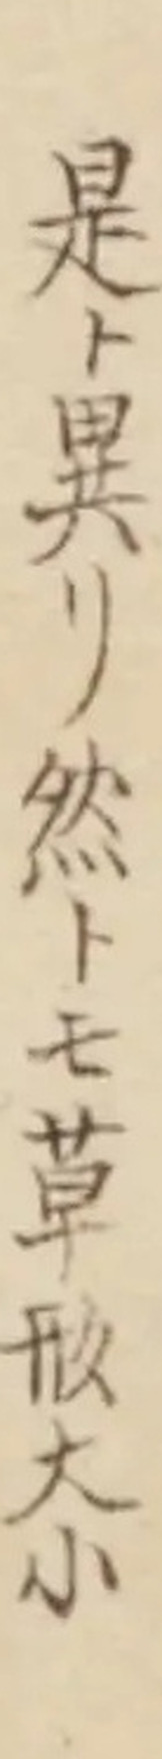是ト異リ然トモ草形大小
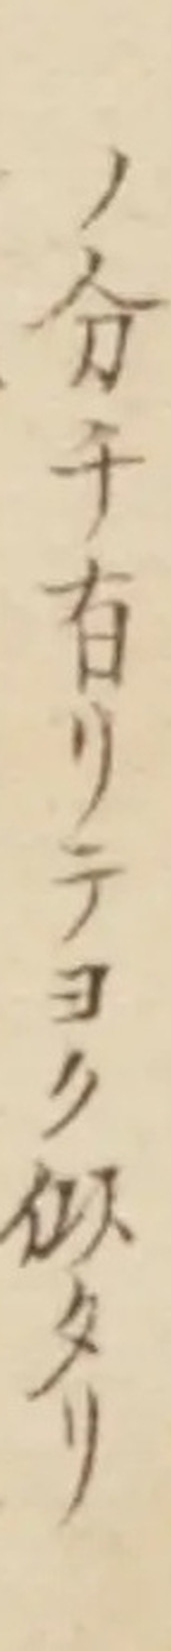ノ分チ有リテヨク似タリ
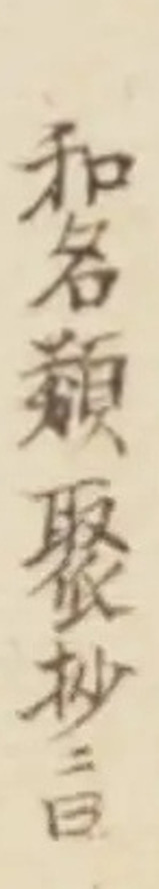和名類聚抄ニ曰
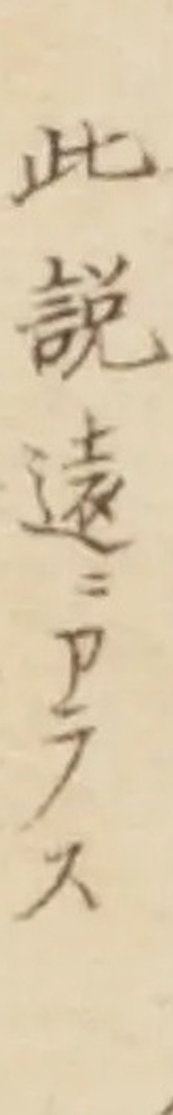此説遠ニアラス
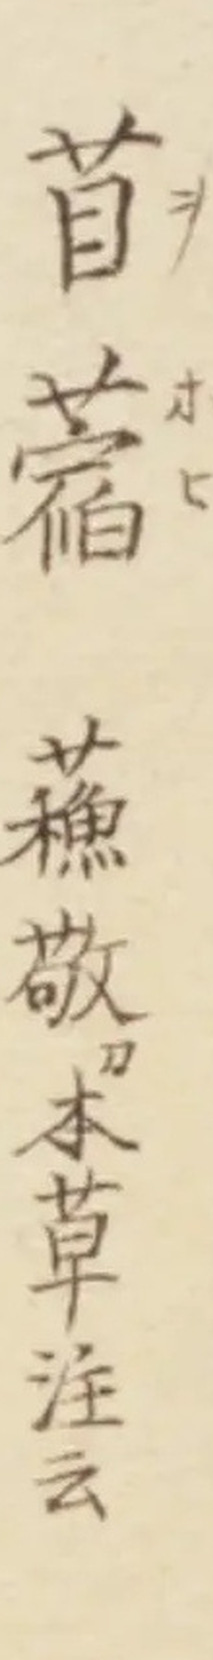苜蓿蘓敬カ本草注ニ云
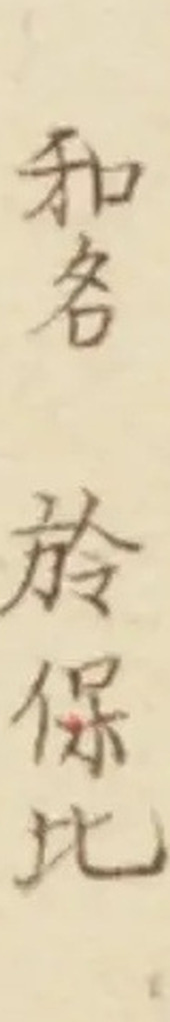和名汚保比
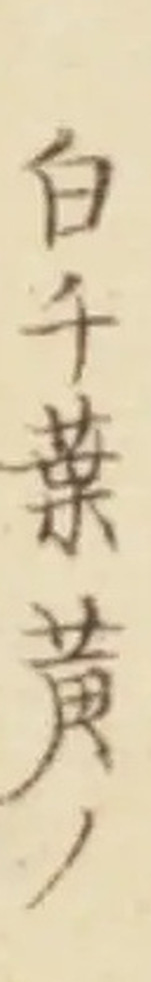白千葉黄ノ
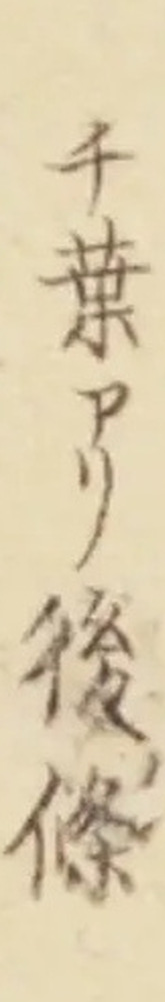千葉アリ後ノ條
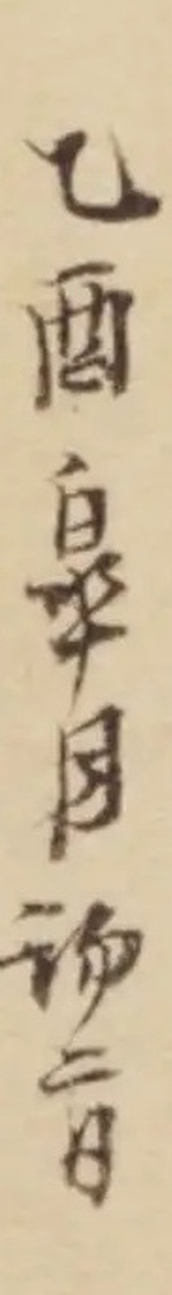乙酉皐月初二日

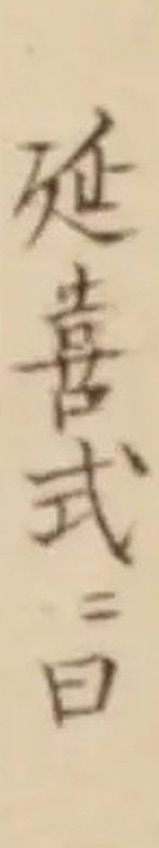延喜式ニ曰
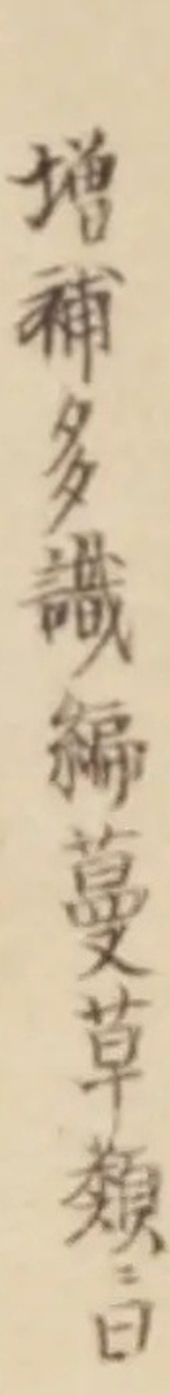増補多識編蔓草類ニ曰
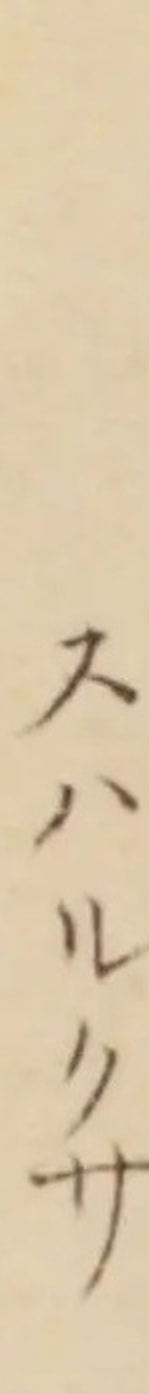スハルクサ
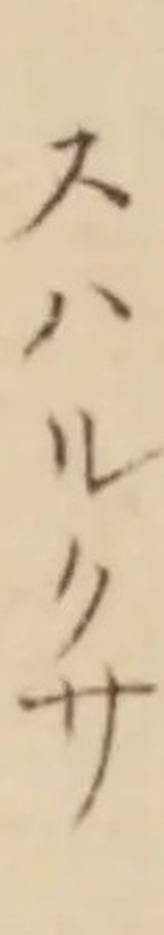スハルクサ
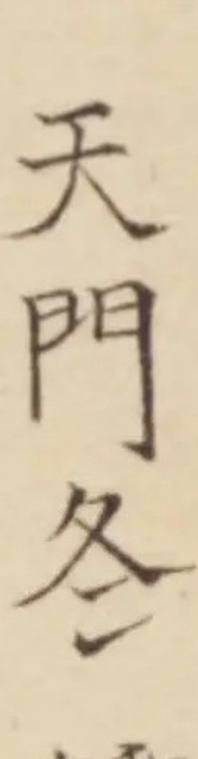天門冬
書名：梅園草木花譜夏之部. 3
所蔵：国立国会図書館 National Diet Library, JAPAN
